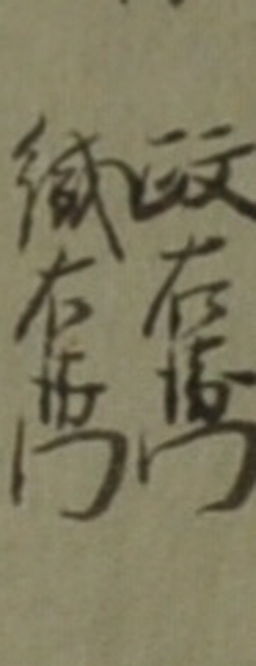緘右衛門
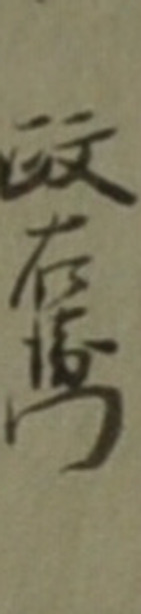緘右衛門
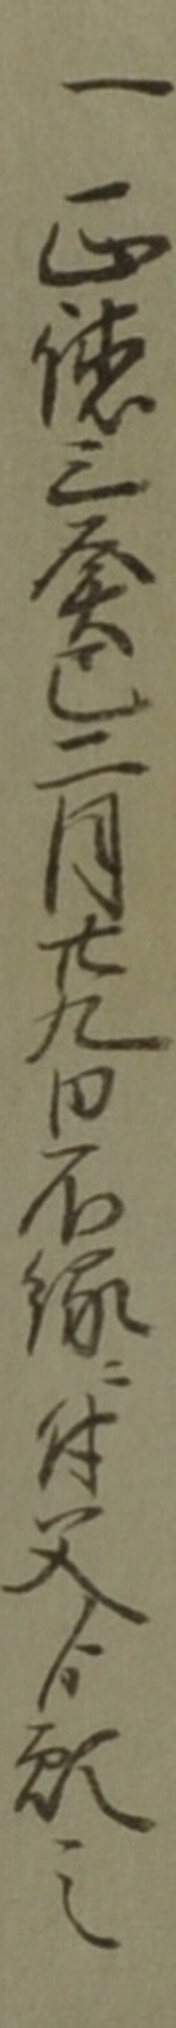一正徳三癸巳二月廿九日不縁ニ付父ゟ願之
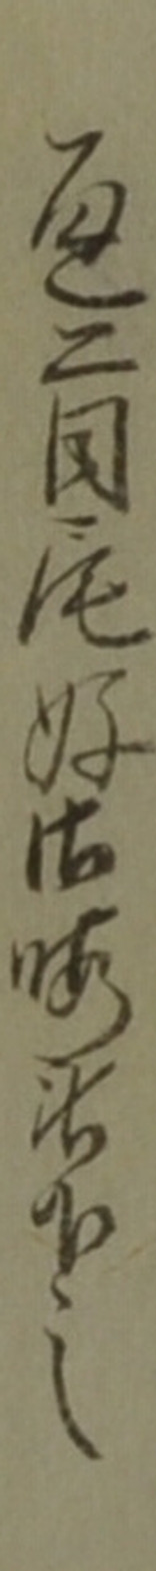通首尾好御暇被下之
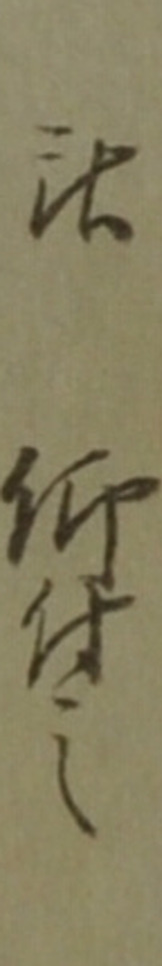被仰付之
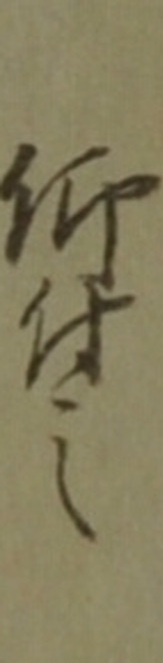仰付之
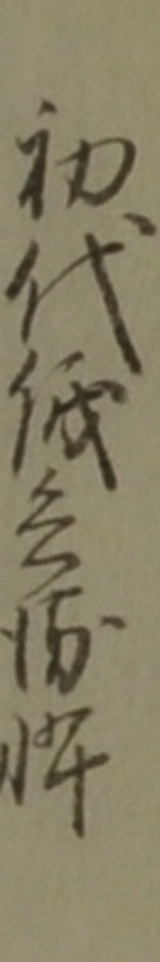初代儀兵衛忰
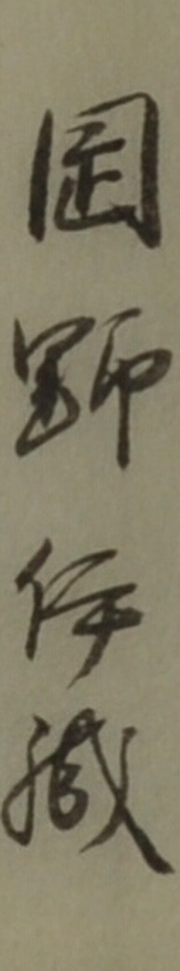岡野伊織
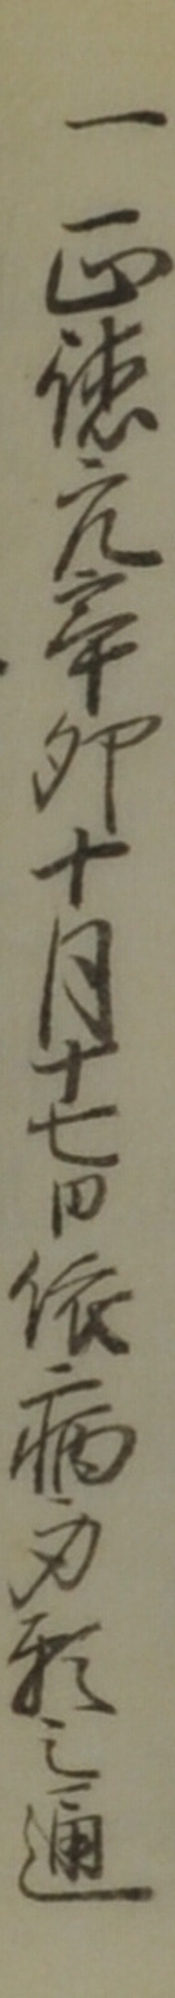一正徳元辛卯十月十七日依病身願之通
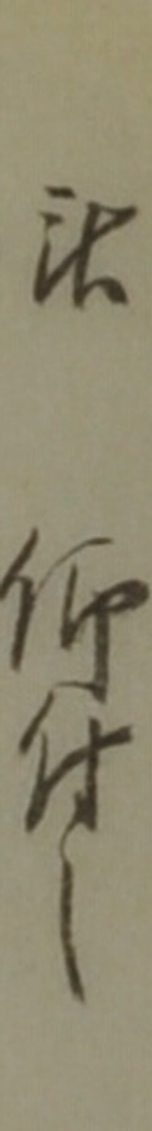被仰付之
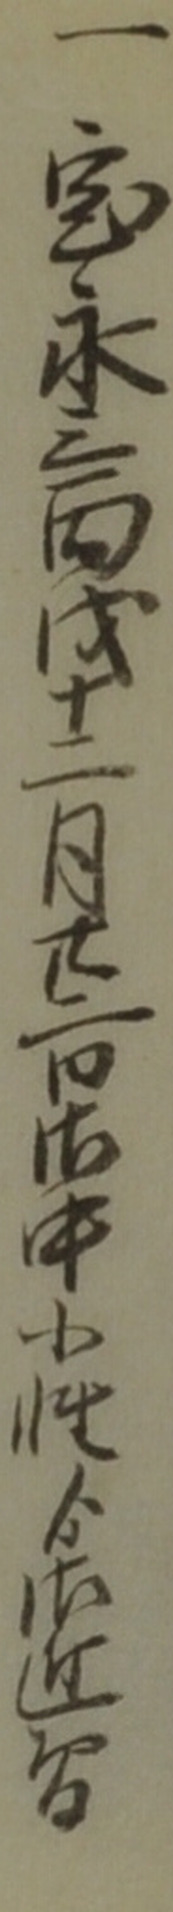一宝永三丙戌十二月廿二日御中小性ゟ御近習
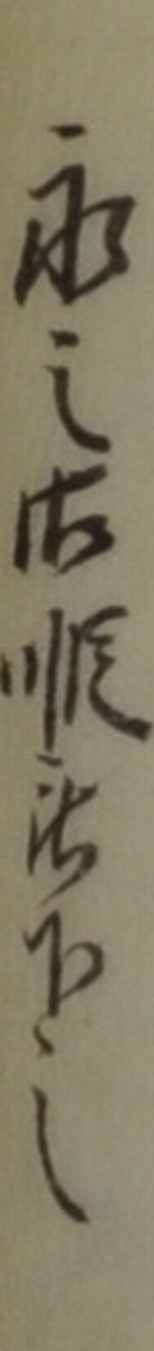永之御暇被下之
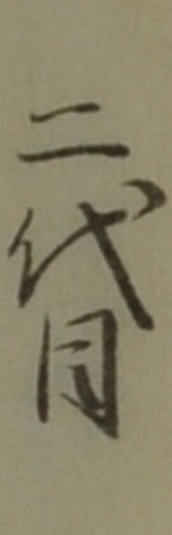二代目
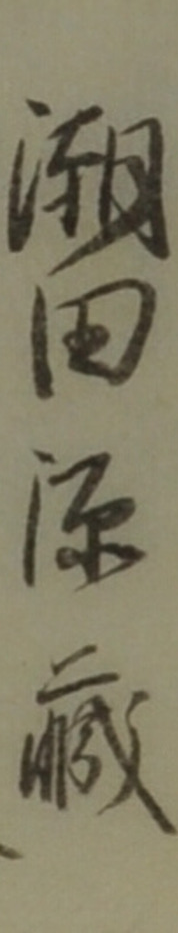潮田源蔵
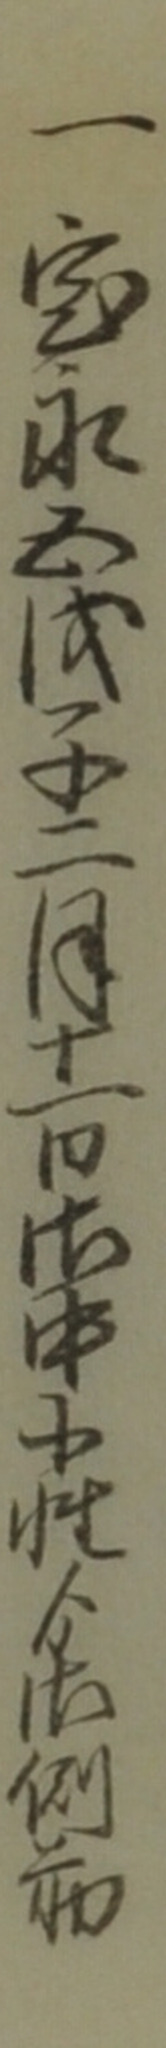一宝永五戊子二月十一日御中小性ゟ御側勤
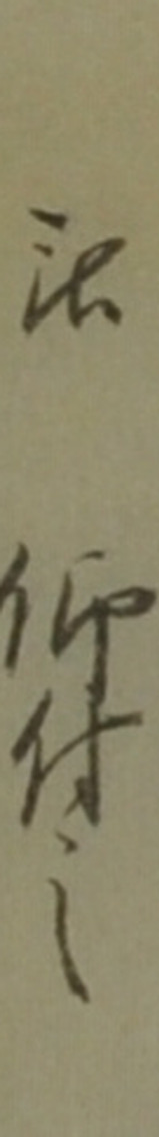被仰付之
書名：諸御役代々録（五）
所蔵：伊那市立高遠町図書館・合同会社AMANE
